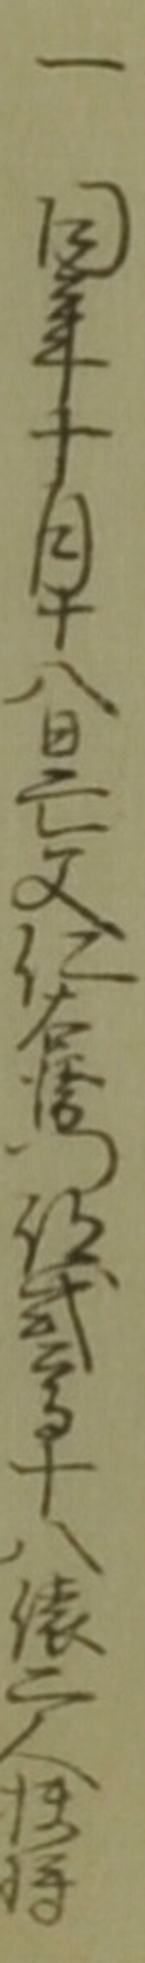一同年十月十八日亡父仁右衛門跡式高十八俵二人扶持
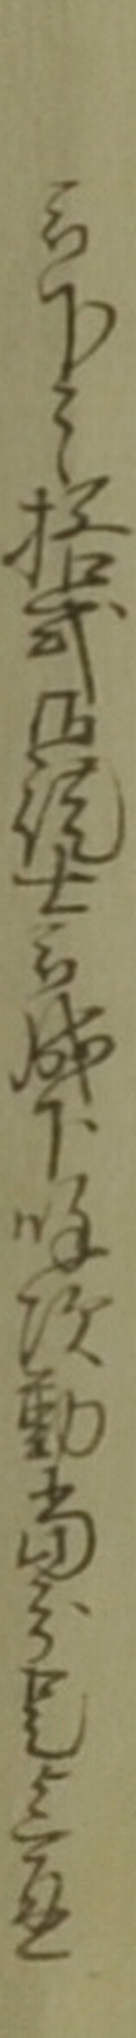被下之格式御徒士被成下呼次勤当分是迄之通

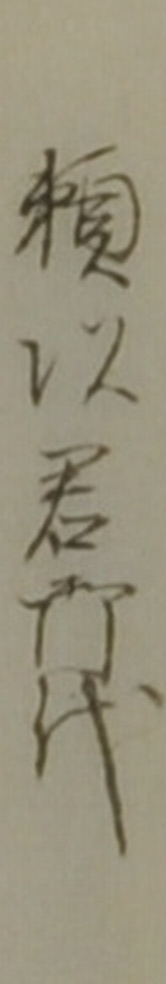頼以君御代
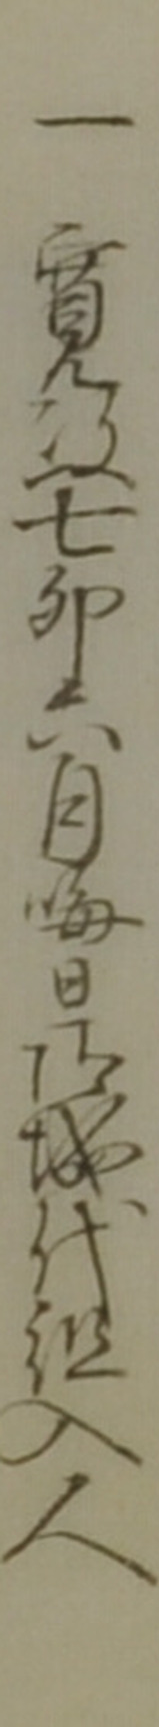一寛政七卯六月晦日御城代組入人
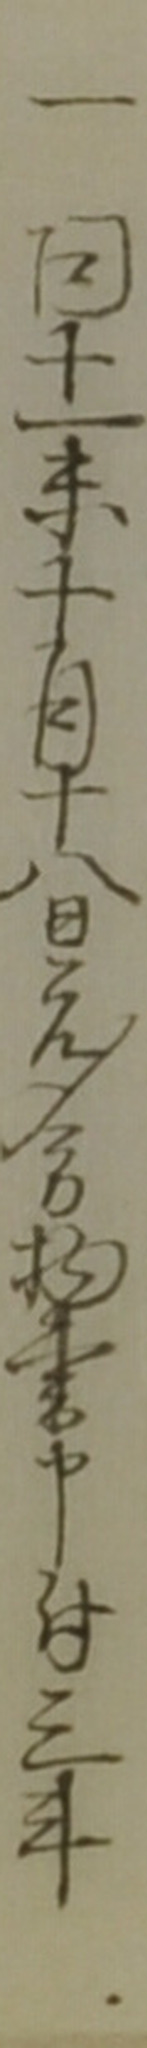一同十一未十月十八日元〆方物書申付三斗
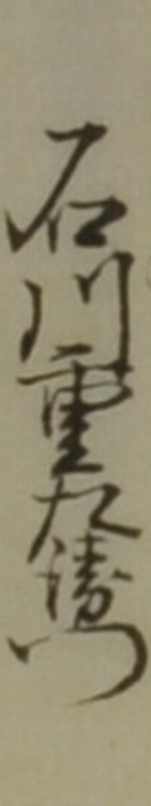石川重左衛門
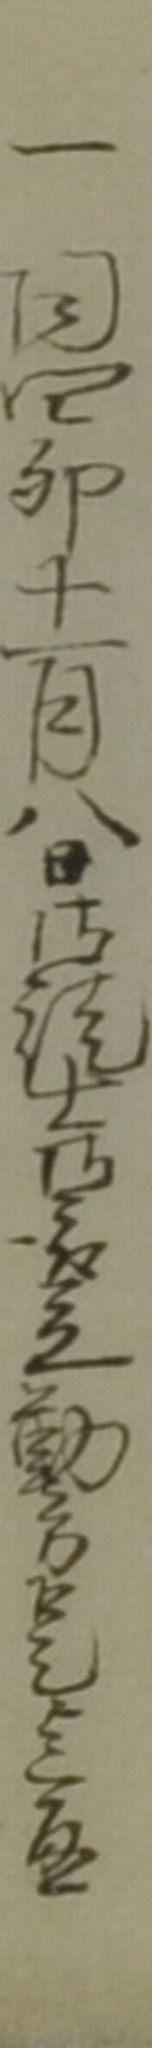一同四卯十一月八日御徒士御◻︎立勤方是迄通
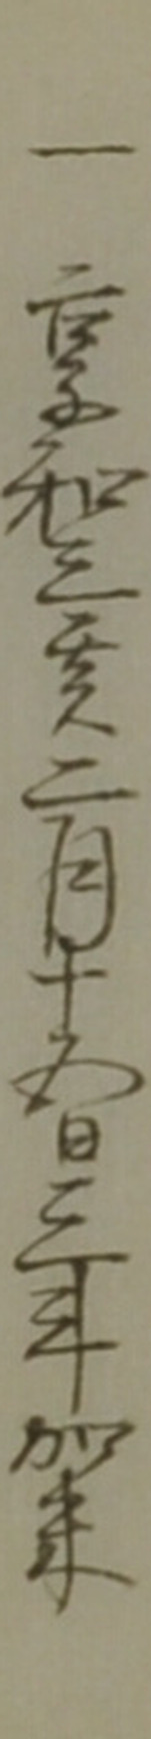一享和三亥二月十五日三斗加来
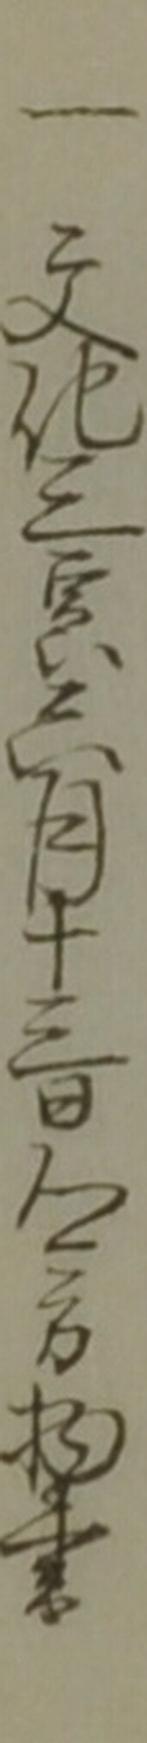一文化三寅六月十三日郷方物書
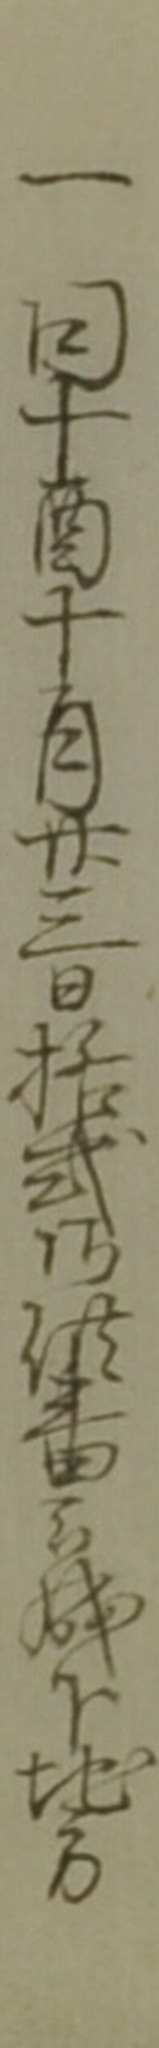一同十酉年十月廿三日格式御供番被成下地方
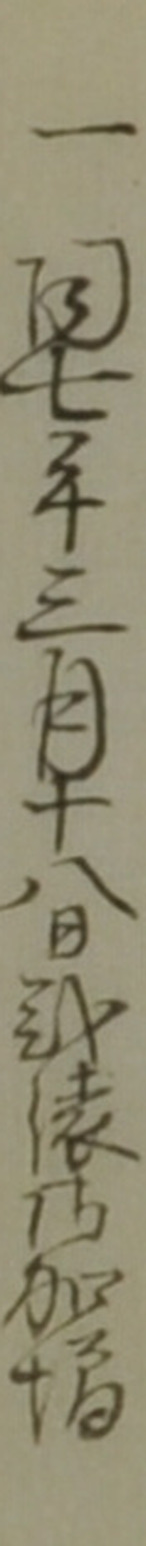一同七午三月十八日貮俵御加増
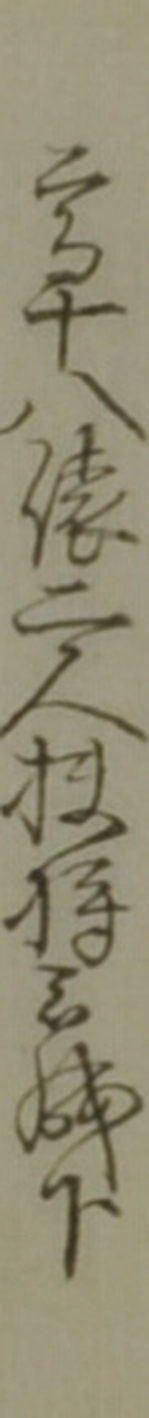高十八俵二人扶持被成下
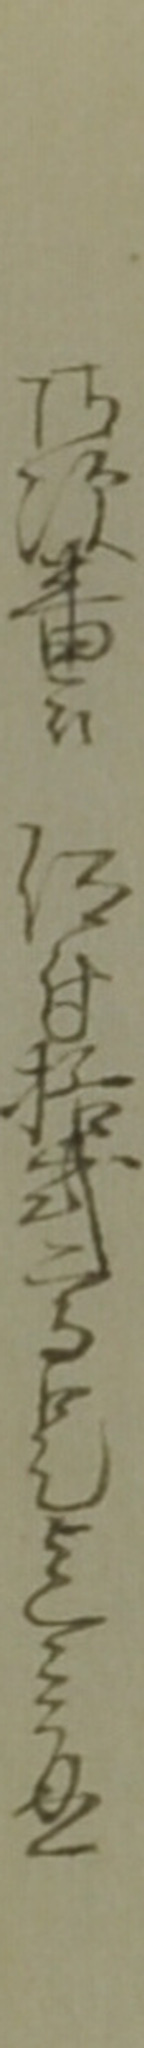御次番被仰付格式高是迄之通
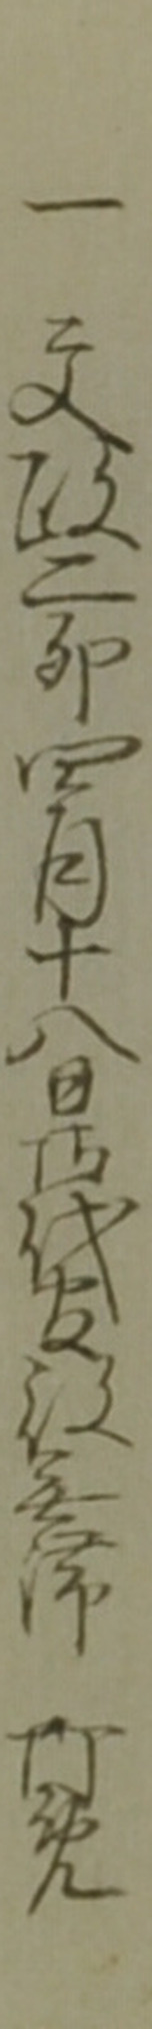一文政二卯四月十八日御代官役無滞御免
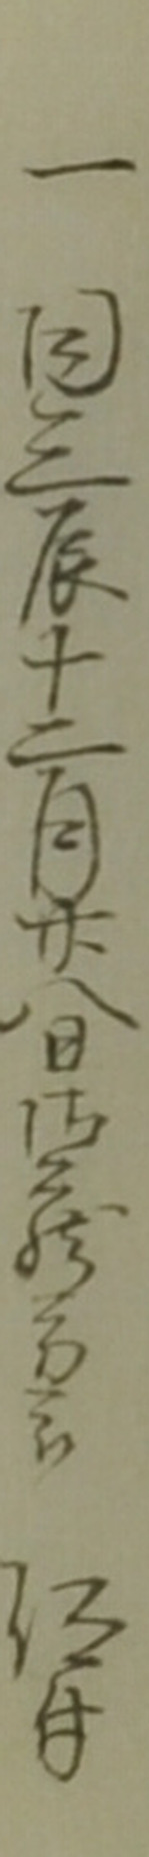一同三辰十二月廿八日御蔵方被仰付
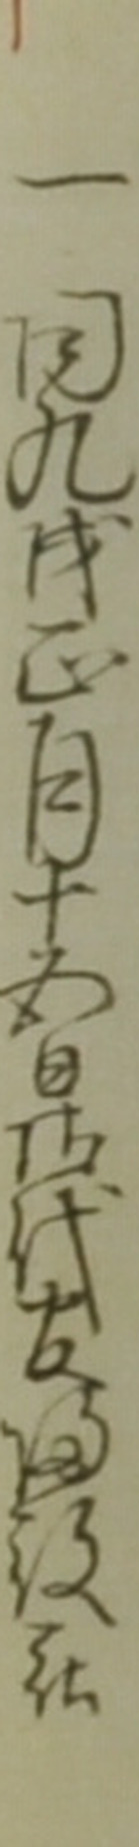一同九戌正月十五日御代官帰役被
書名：無足諸士勤仕録（五）
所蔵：伊那市立高遠町図書館・合同会社AMANE
